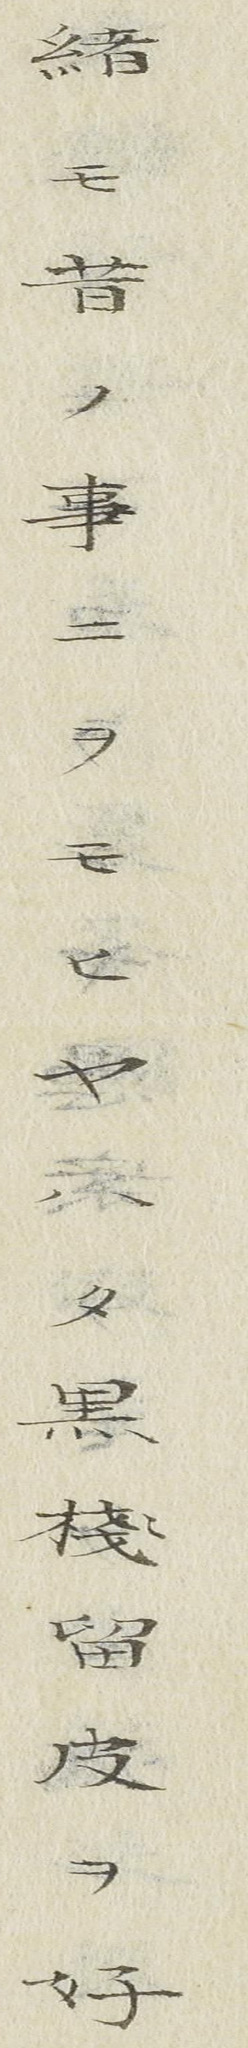緒モ昔ノ事ニヲモヒヤハタ黒桟留皮ヲ好
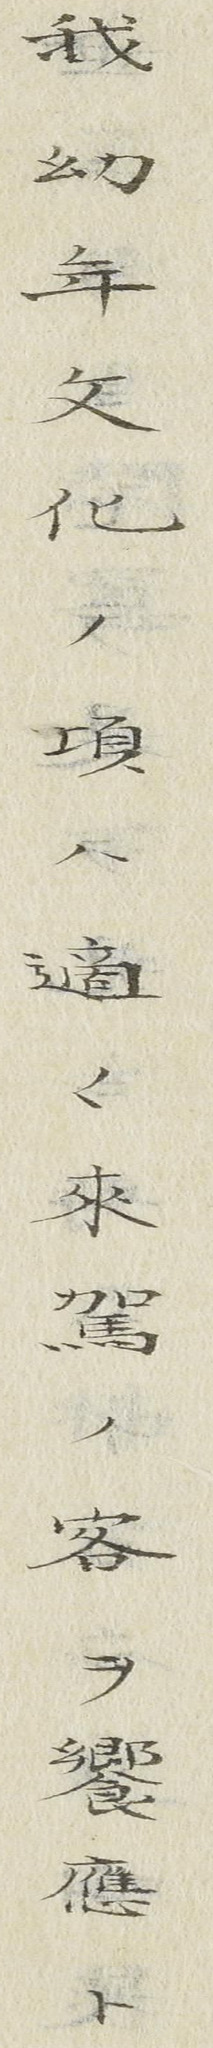我幼年文化ノ頃ハ適々来駕ノ客ヲ饗応ト
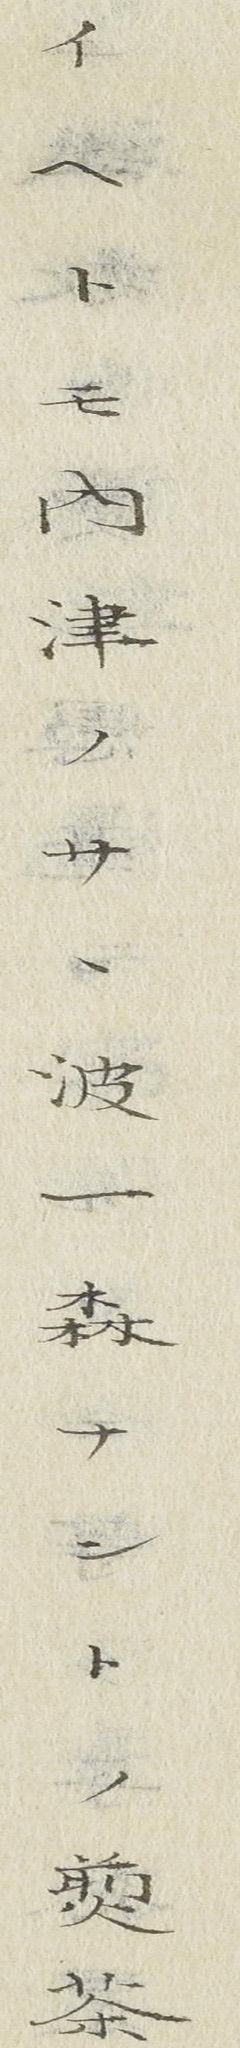イヘトモ内津ノサヽ波一森ナントノ煎茶
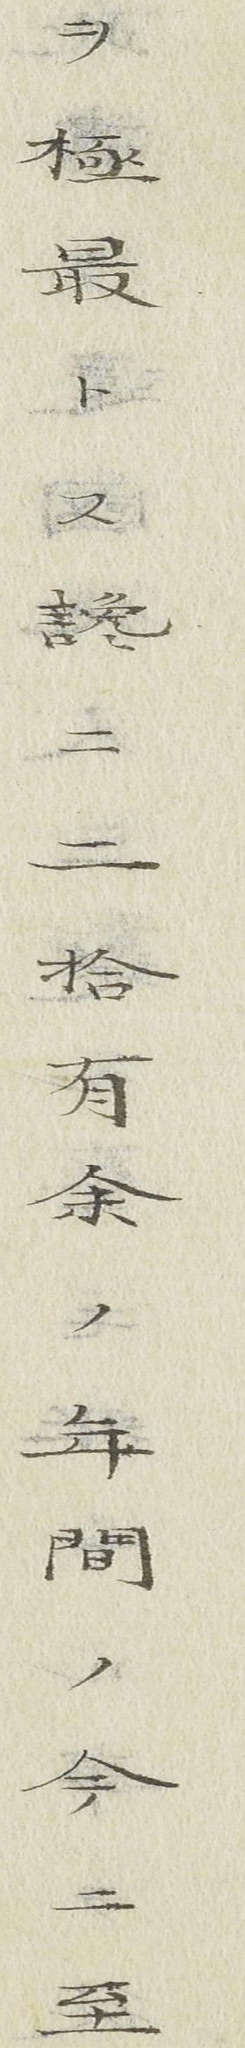ヲ極最トス讒ニ二拾有余ノ年間ノ今ニ至
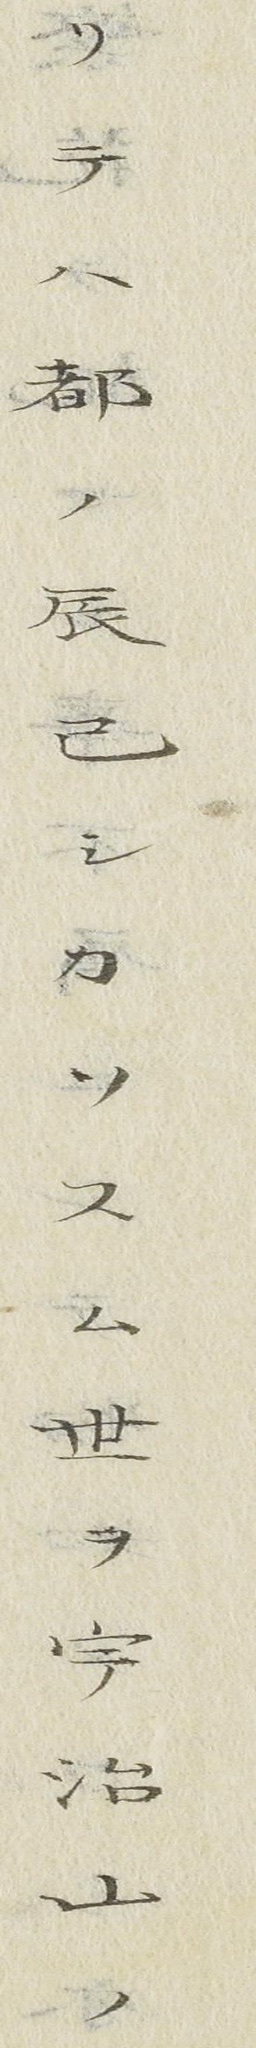リテハ都ノ辰巳シカソスム世ヲ宇治山ノ
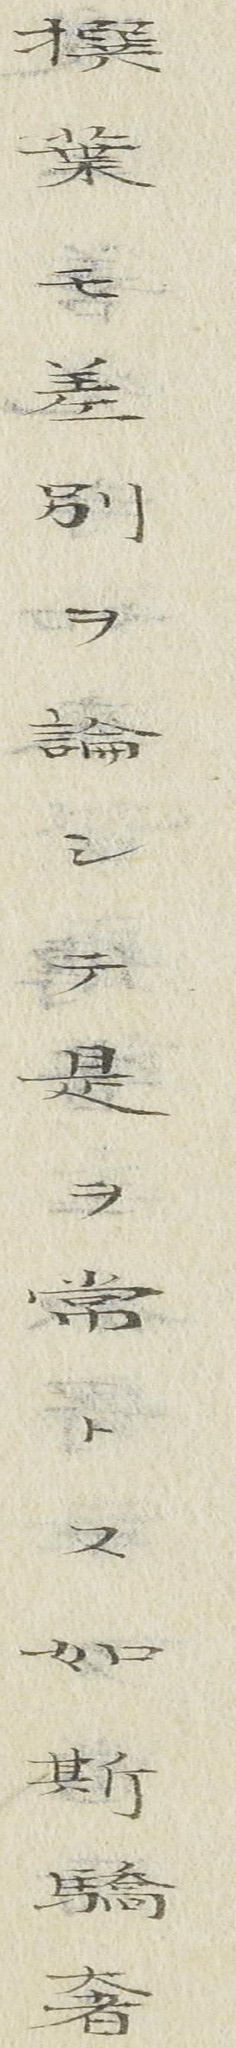撰葉モ差別ヲ論シテ是ヲ常トス如斯驕奢
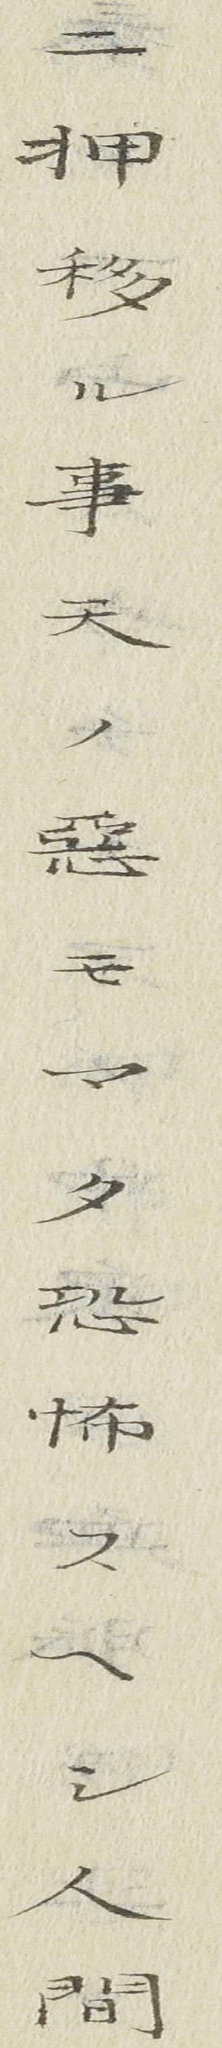ニ押移ル事天ノ悪モマタ恐怖スヘシ人間
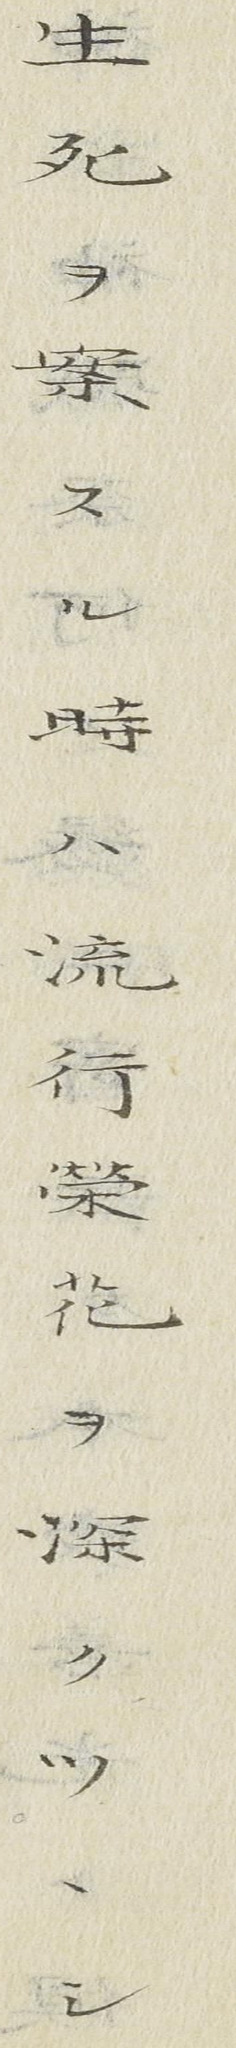生死ヲ案スル時ハ流行栄花ヲ深クツヽシ
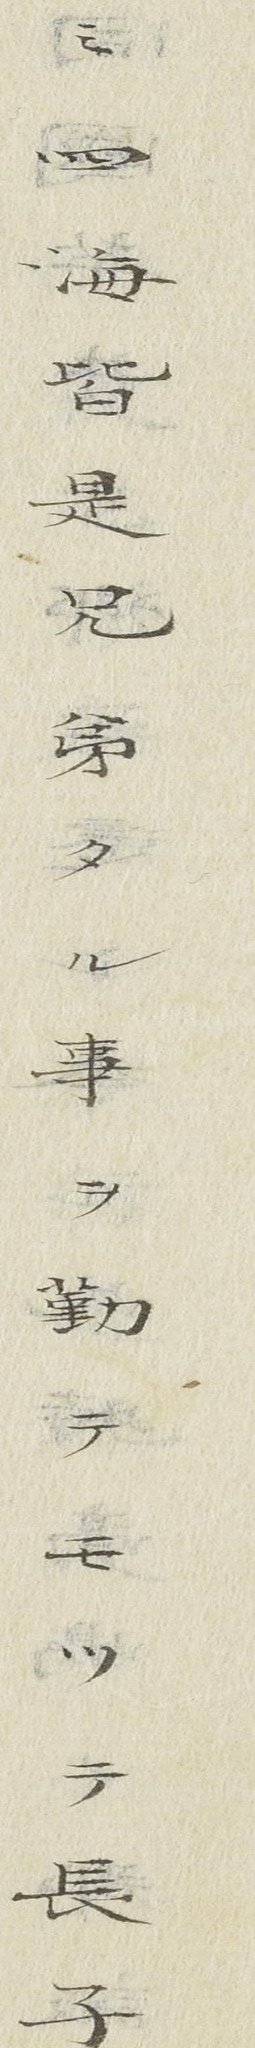ミ四海皆是兄弟タル事ヲ勤テモツテ長子
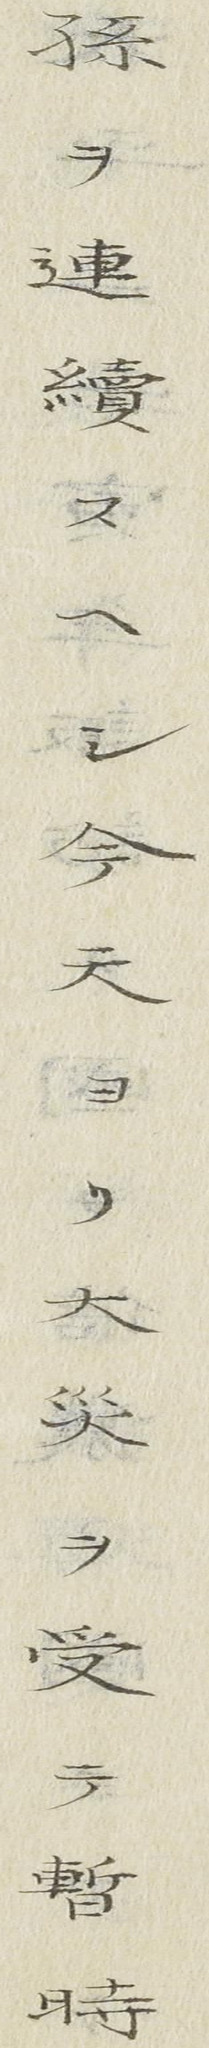孫ヲ連続スヘシ今天ヨリ大災ヲ受テ暫時
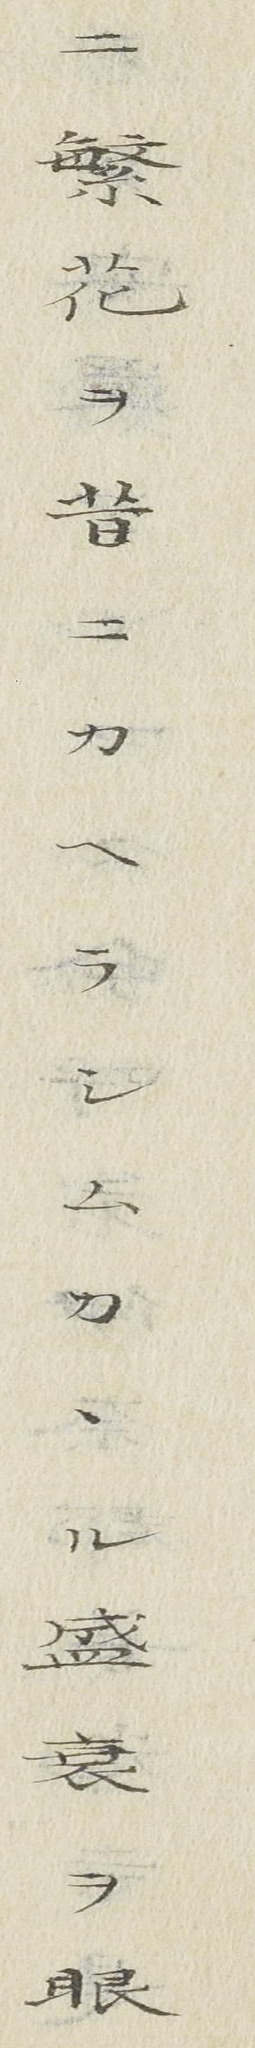ニ繁花ヲ昔ニカヘラシムカヽル盛衰ヲ眼
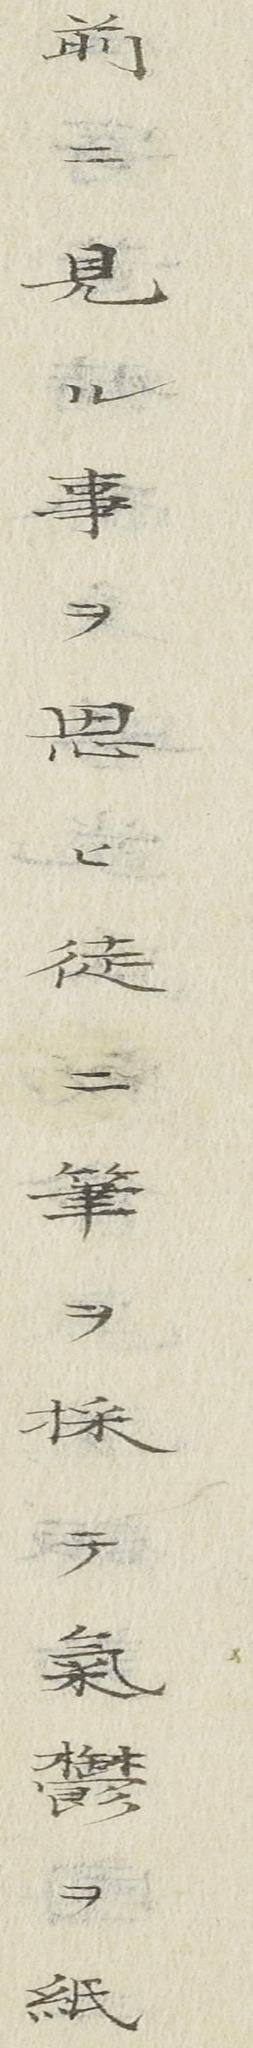前ニ見ル事ヲ思ヒ徒ニ筆ヲ採テ気鬱ヲ紙
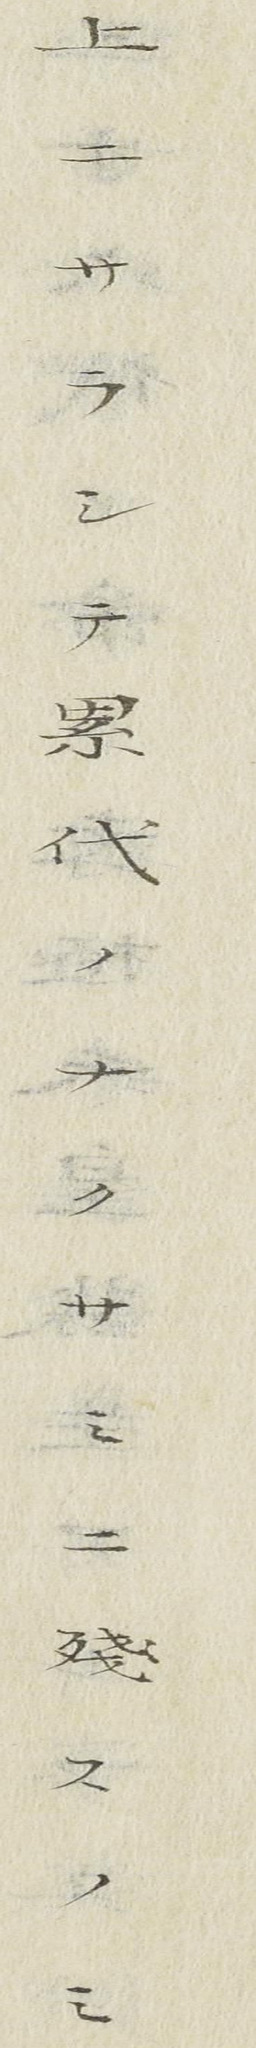上ニサラシテ累代ノナクサミニ残スノミ
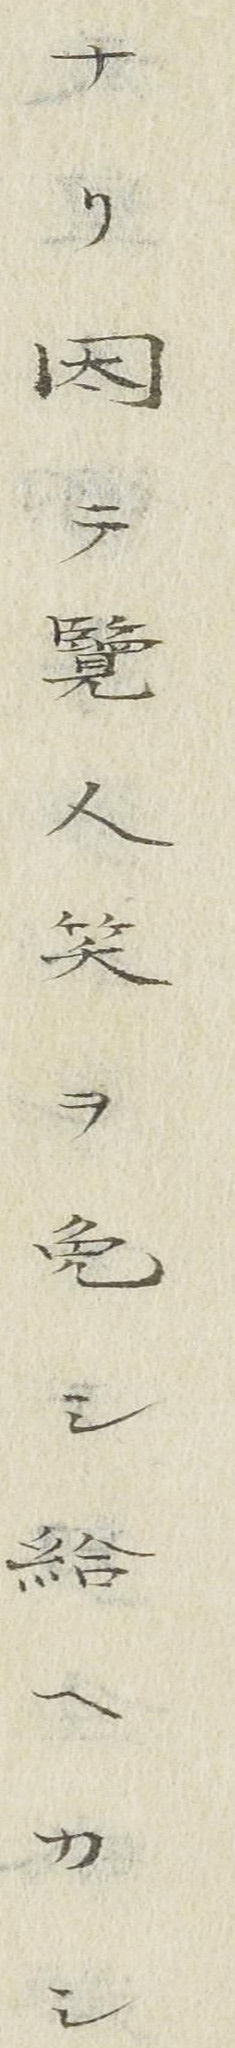ナリ因テ覧人笑ヲ免シ給ヘカシ
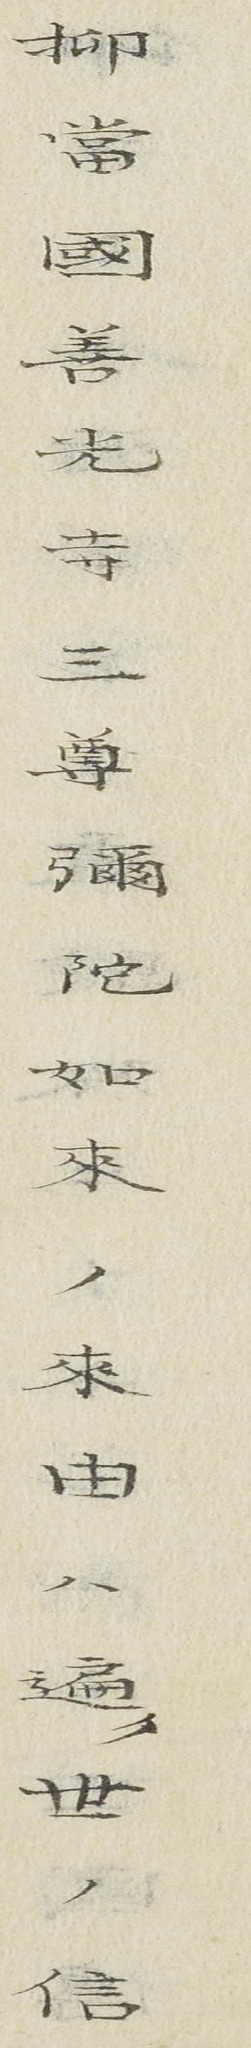抑当国善光寺三尊阿弥陀如来ノ来由ハ遍ク世ノ信

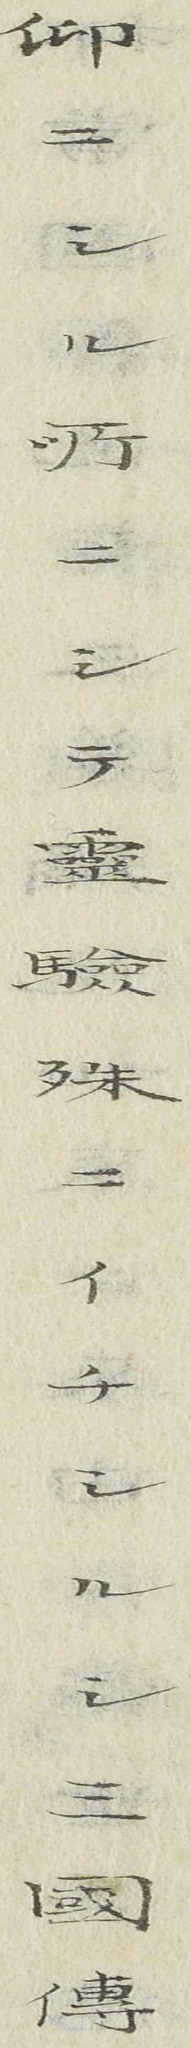仰ニシル所ニシテ霊験殊ニイチシルシ三国伝
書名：地災撮要　地震之部　巻ノ二
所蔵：東京大学地震研究所図書室 Earthquake Research Institute Library, The University of Tokyo, JAPAN
